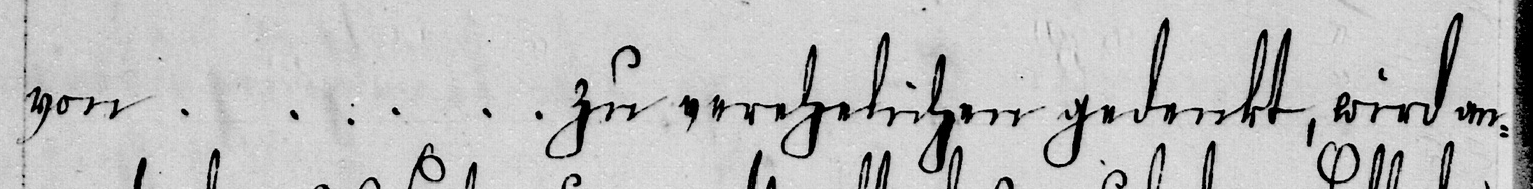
von … zu verehelichen gedenkt, wird an¬
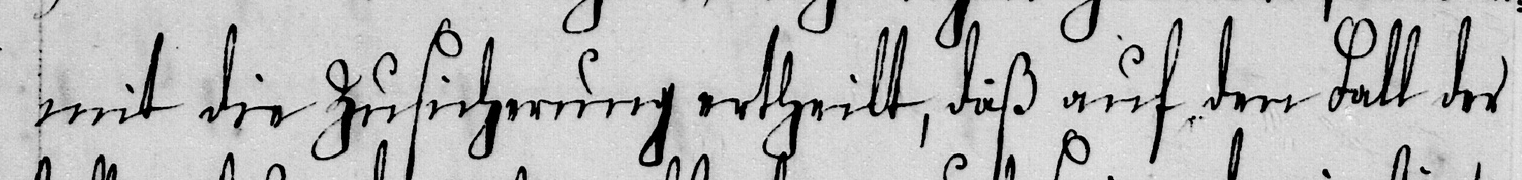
mit die Zusicherung ertheilt, daß auf den Fall der
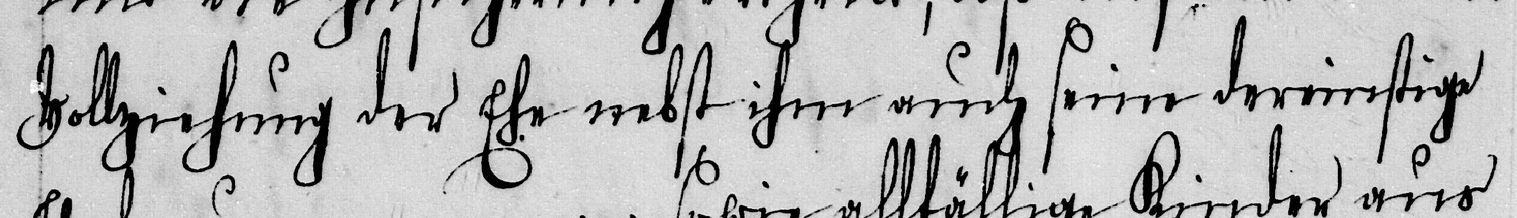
Vollziehung der Ehe nebst ihm auch seine dereinstige
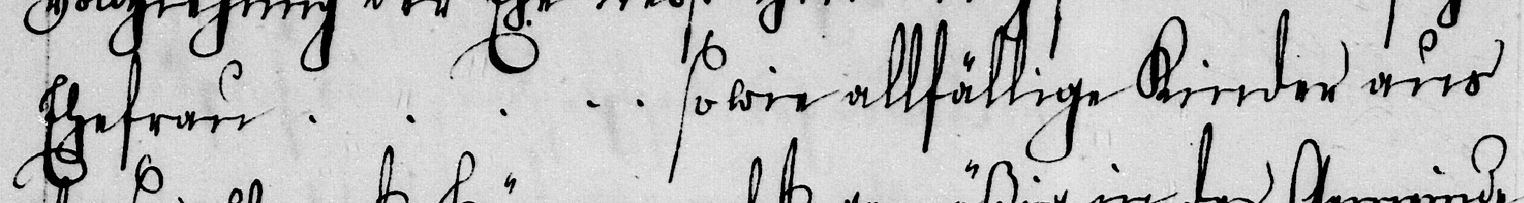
Ehefrau … sowie allfällige Kinder aus
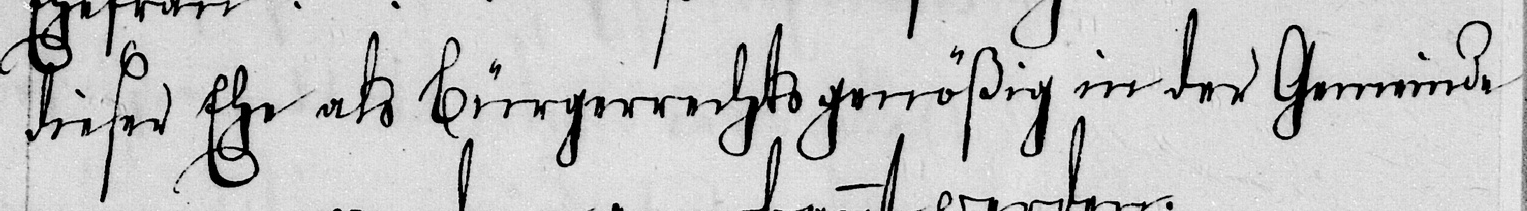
dieser Ehe als Bürgerrechtsgenößig in der Gemeinde
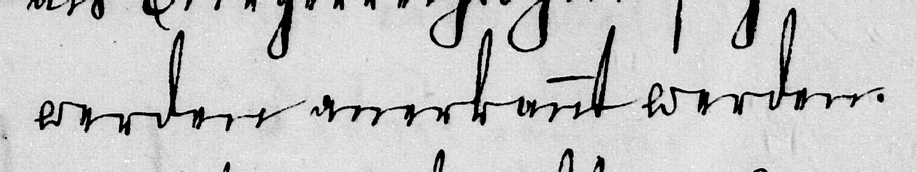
werden anerkannt werden.
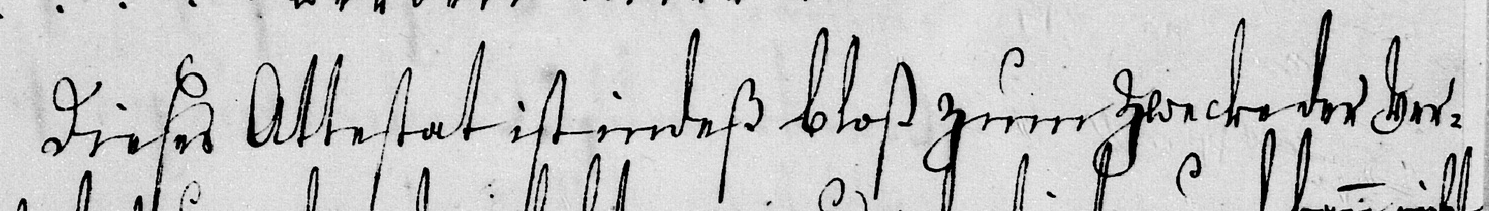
Dieses Attestat ist indeß bloß zum Zwecke der Ver¬
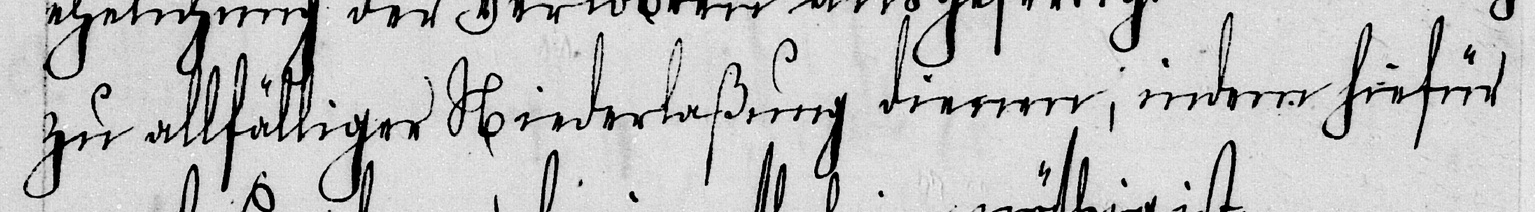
zu allfälliger Niederlaßung dienen, indem hiefür
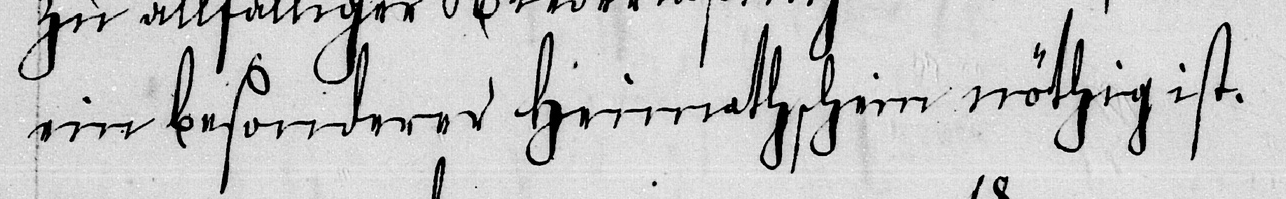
ein besonderer Heimathschein nöthig ist.
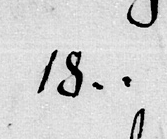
18 …
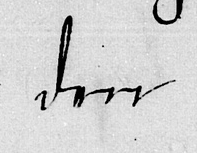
den
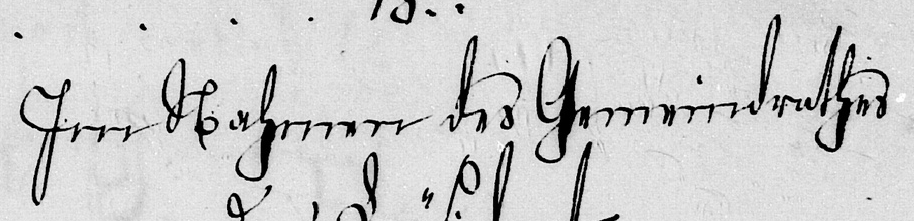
Im Nahmen des Gemeindrathes
